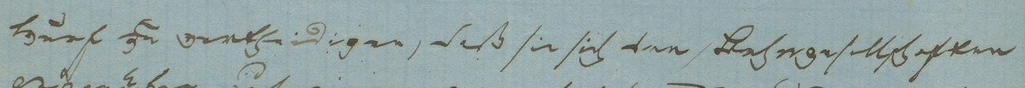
wurf zu vertheidigen, daß sie sich den Bahngesellschaften
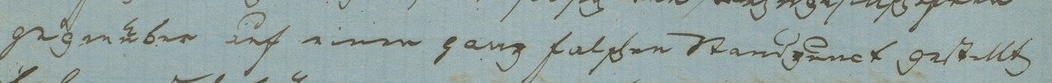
gegenüber auf einen ganz falschen Standpunct gestellt
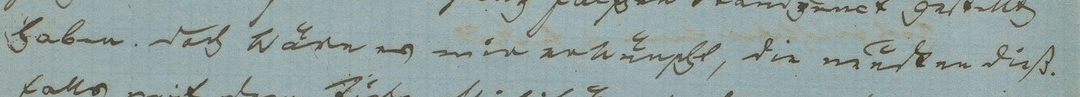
haben. Doch wäre es mir erwünscht, die neusten dieß-
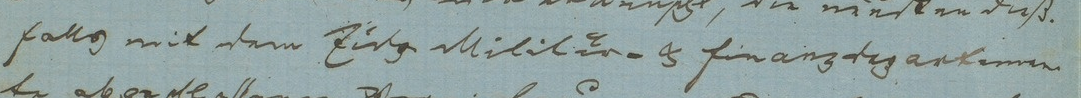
falls mit dem Eidg. Militär- & Finanzdepartemen-
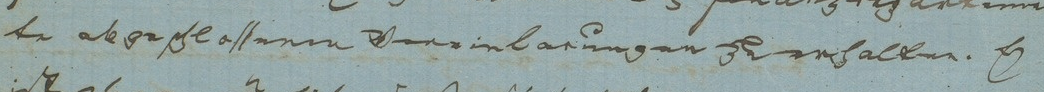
te abgeschlossenen Vereinbarungen zu erhalten. Es
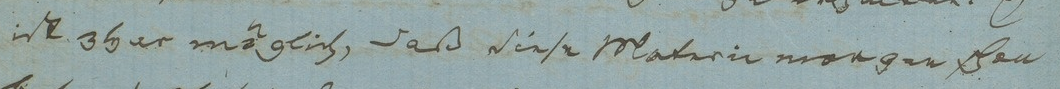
ist aber möglich, daß diese Materie morgen schon
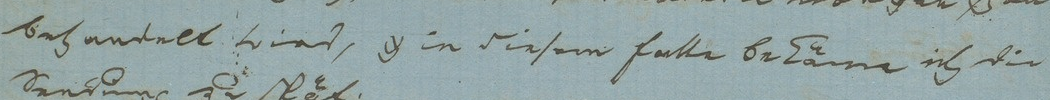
behandelt wird, & in diesem Falle bekäme ich die
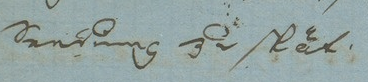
Sendung zu spät.
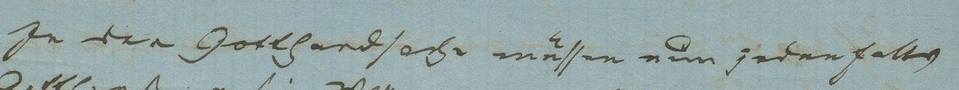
In der Gotthardsache müssen nun jedenfalls
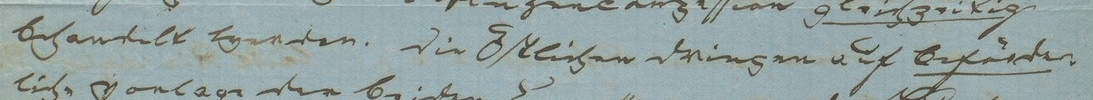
behandelt werden. Die Östlichen dringen auf beförder-
